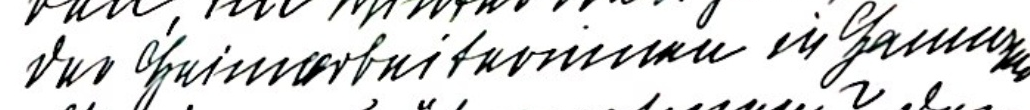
der Heimarbeiterinnen in Hanns-
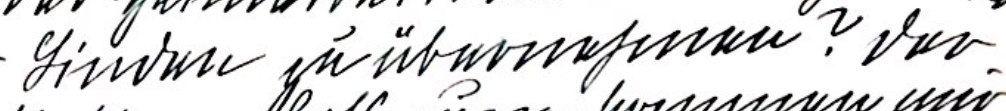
Sinchen zu übernehmen? Der
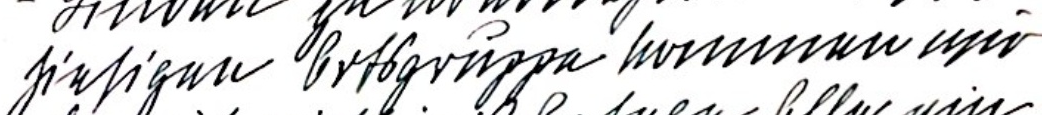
zeitigen Ortsgruppe kommen wir
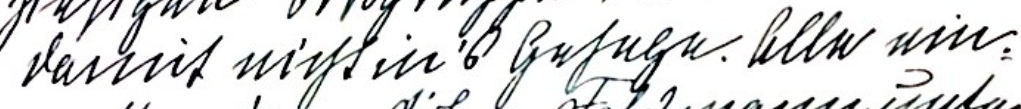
damit nicht in's Gehege. Alle ein
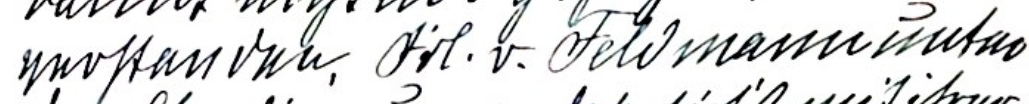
verstanden. Frl. v. Feldmann unter
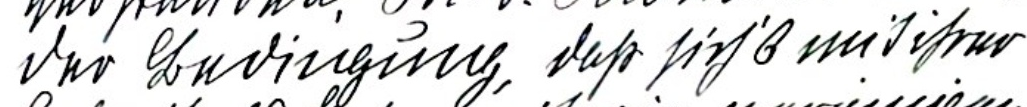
der Bedingung, daß sich's mit ihrer
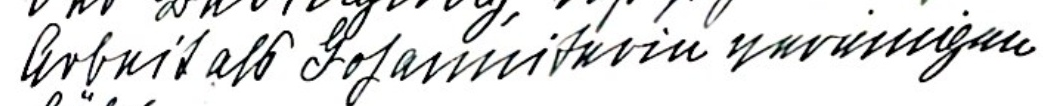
Arbeit als Johanniterin vereinigen
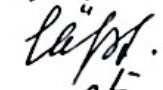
läßt.
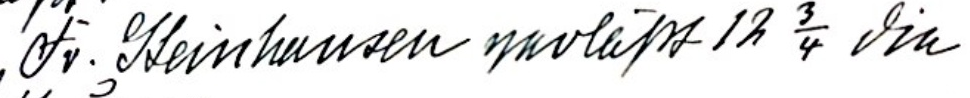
Fr. Steinhausen verläßt 12¾ die
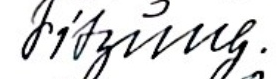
Sitzung.
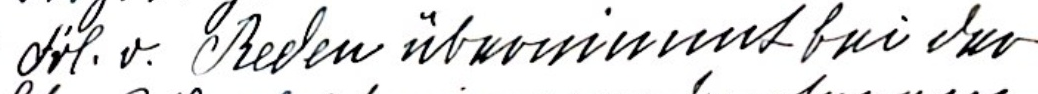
Frl. v. Beelen übernimmt bei der
